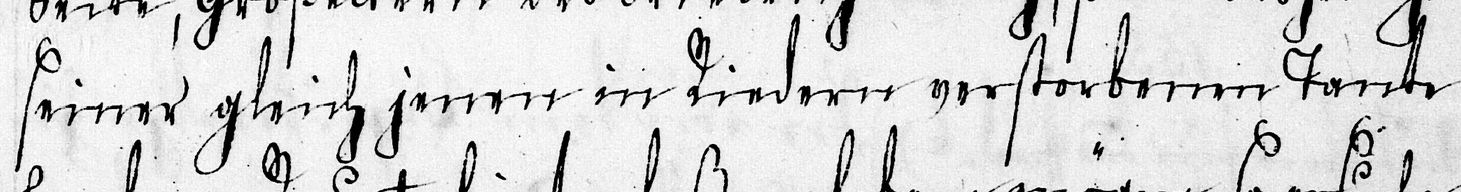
seiner gleich jenen in Riedern verstorbenen Tante
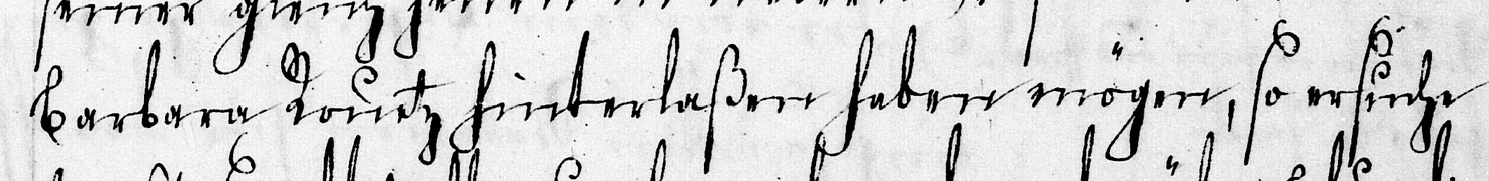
Barbara Rouetz hinterlaßen haben mögen, so ersuche
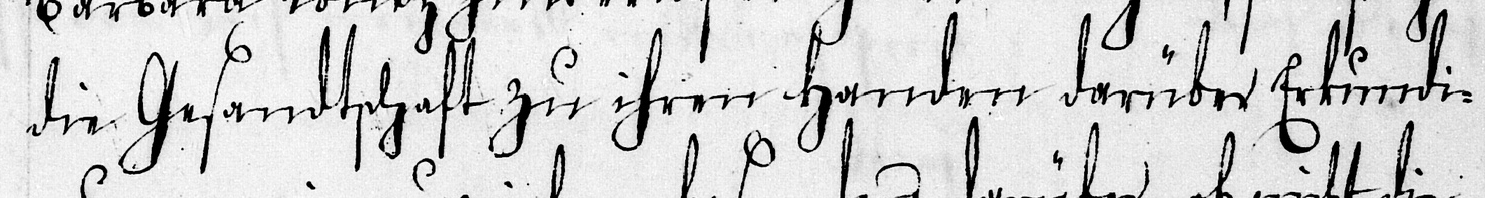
die Gesandtschaft zu ihren Handen darüber Erkundi¬
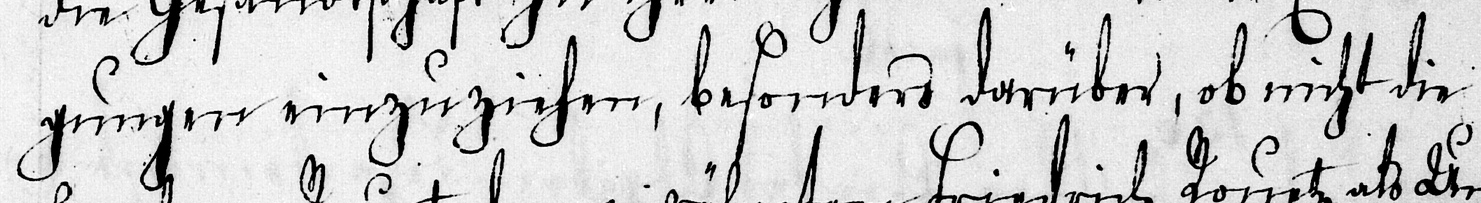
gungen einzuziehen, besonders darüber, ob nicht die
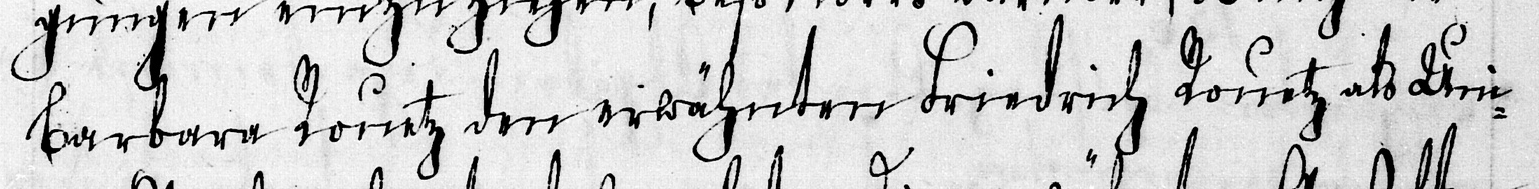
Barbara Rouetz den erwähnten Friedrich Rouetz als Uni¬
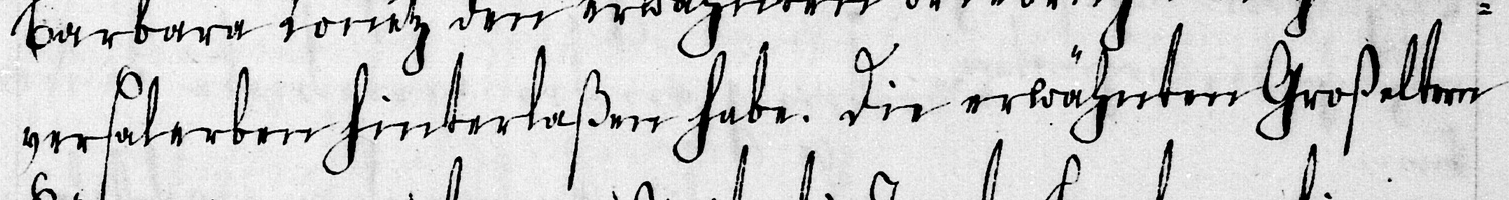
versalerben hinterlaßen habe. Die erwähnten Großeltern
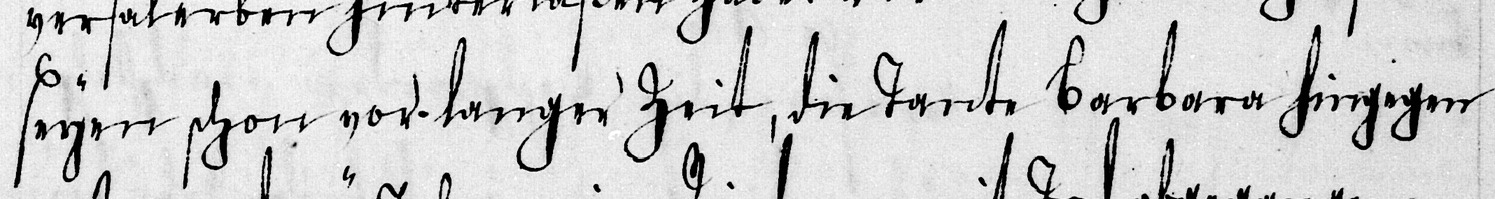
seyen schon vor langer Zeit, die Tante Barbara hingegen
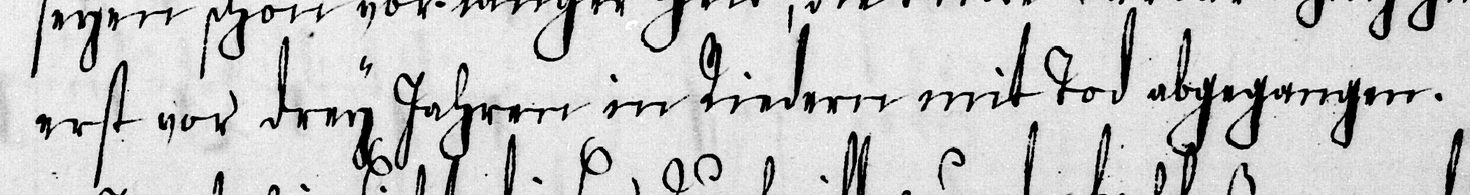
erst vor drey Jahren in Riedern mit Tod abgegangen.
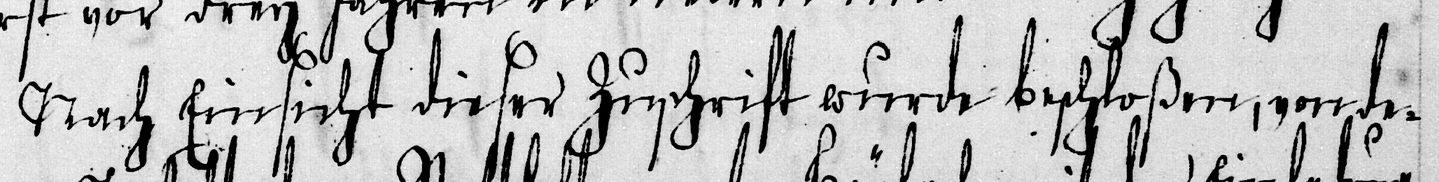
Nach Einsicht dieser Zuschrift wurde beschloßen, von de¬
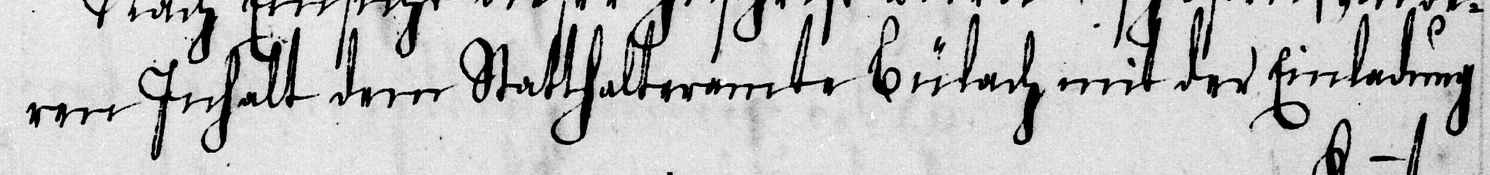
ren Inhalt dem Statthalteramte Bülach mit der Einladung
